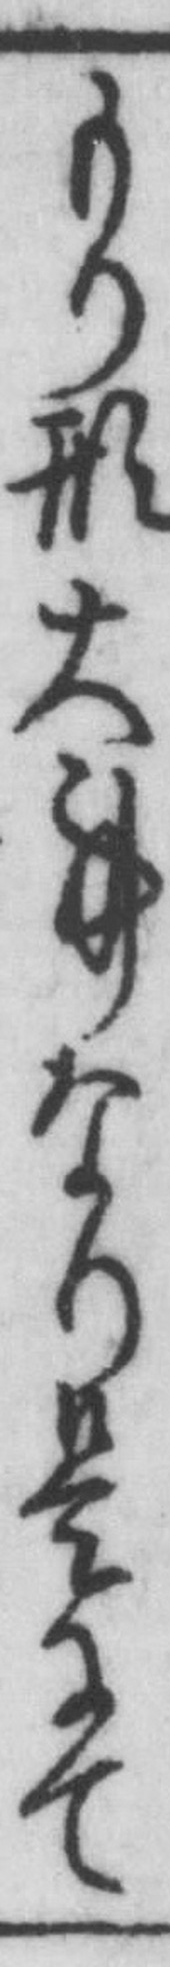もり形大事なり是にて
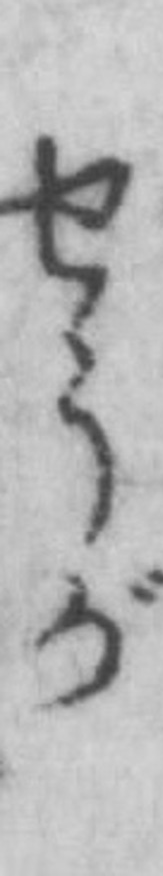せうが
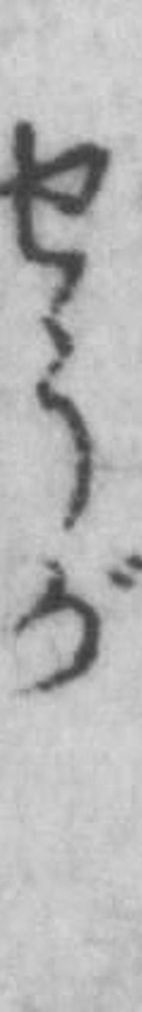せうが
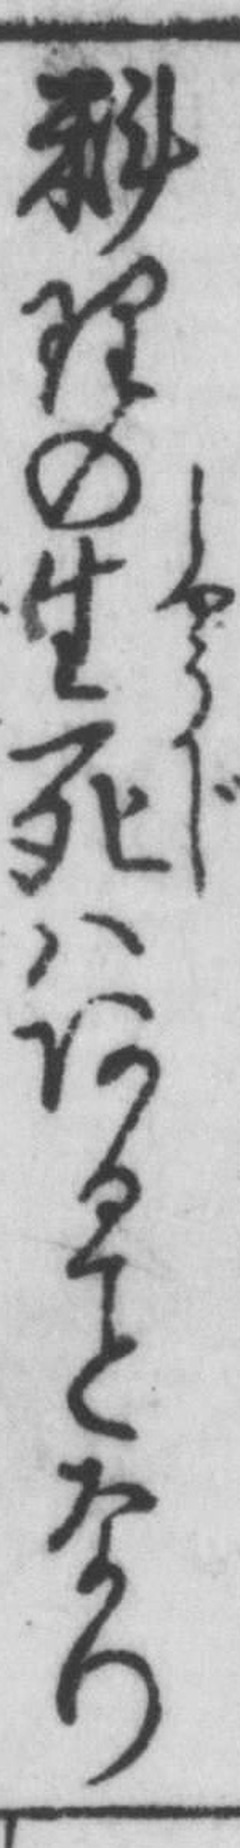料理の生死ハあとなり
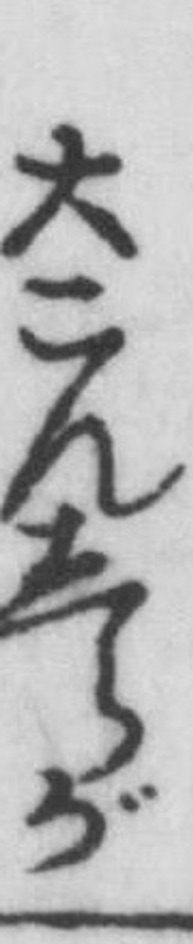大こんしい竹
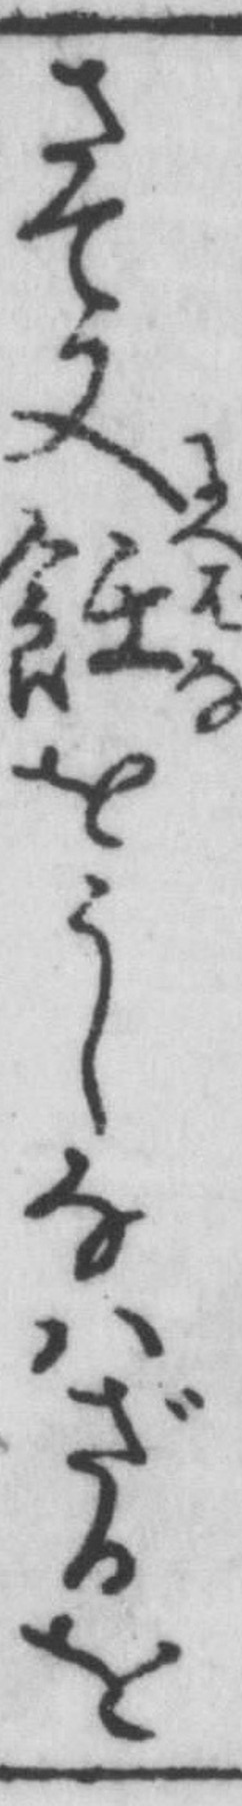さて又飪をうしなハざるを
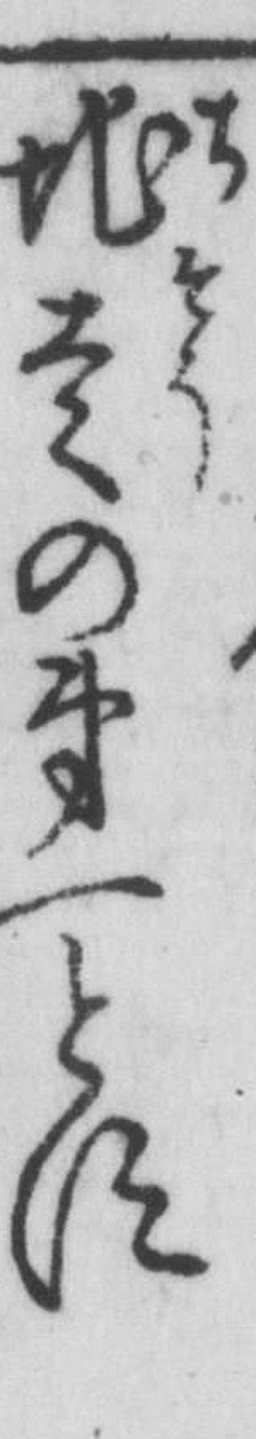馳走の第一とす
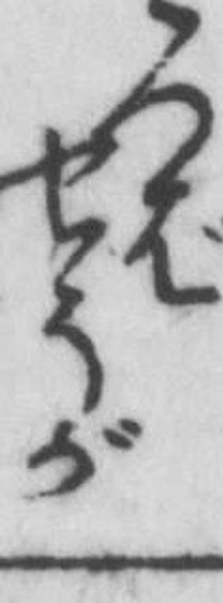せうが
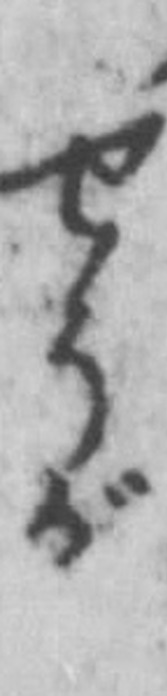せうが
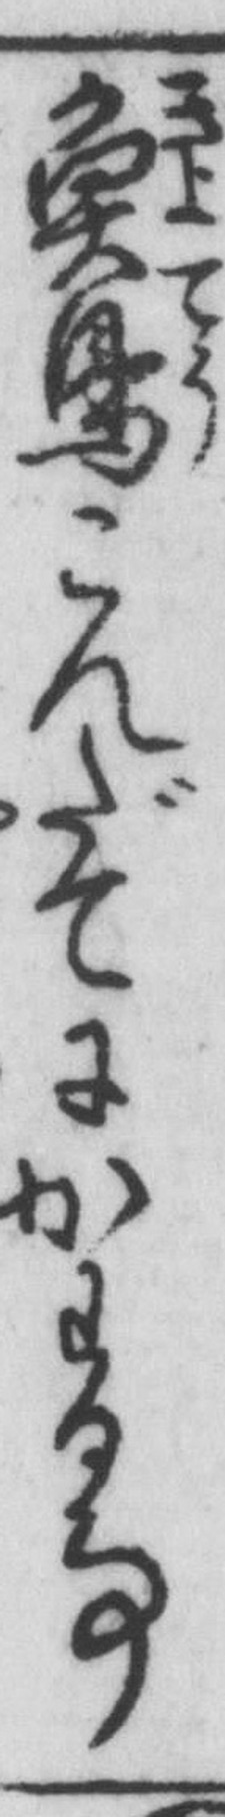魚鳥こんだてにかわる
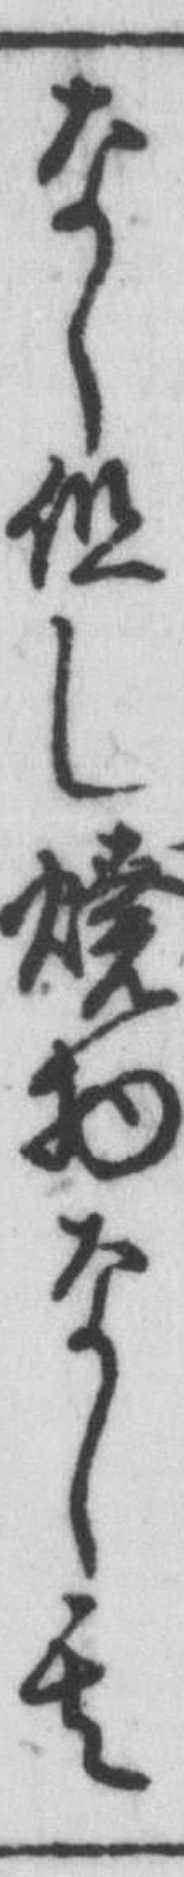なし但し焼物なし其
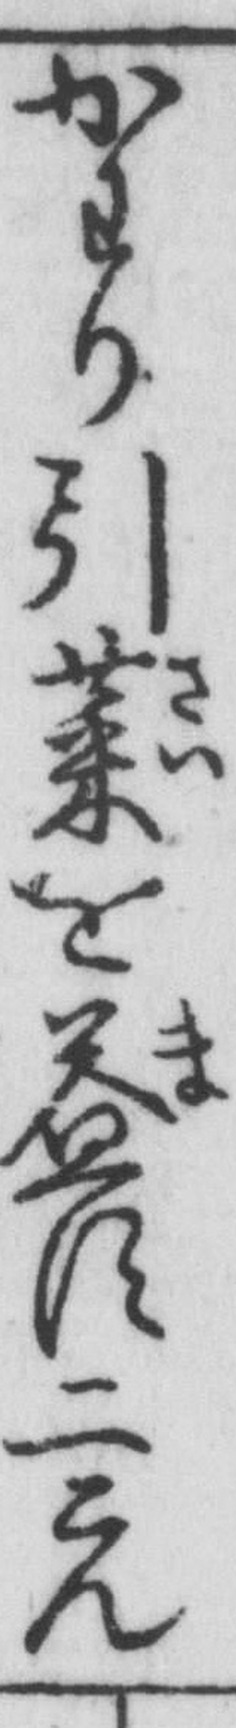かわり引菜をます二こん
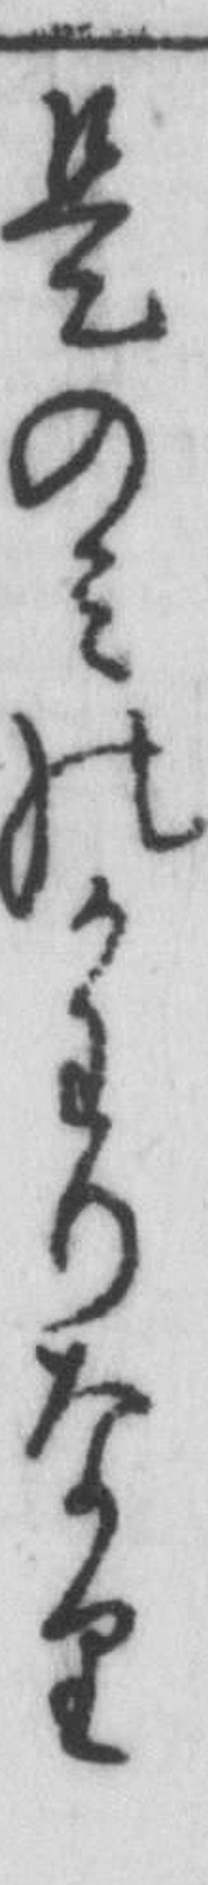是のみのかわりなり
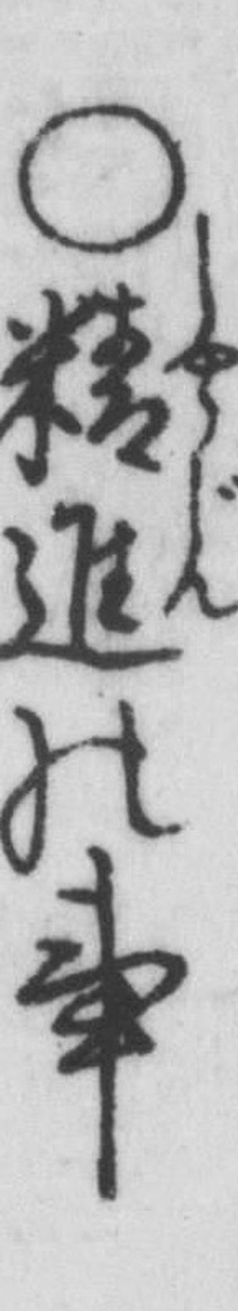〇精進の事
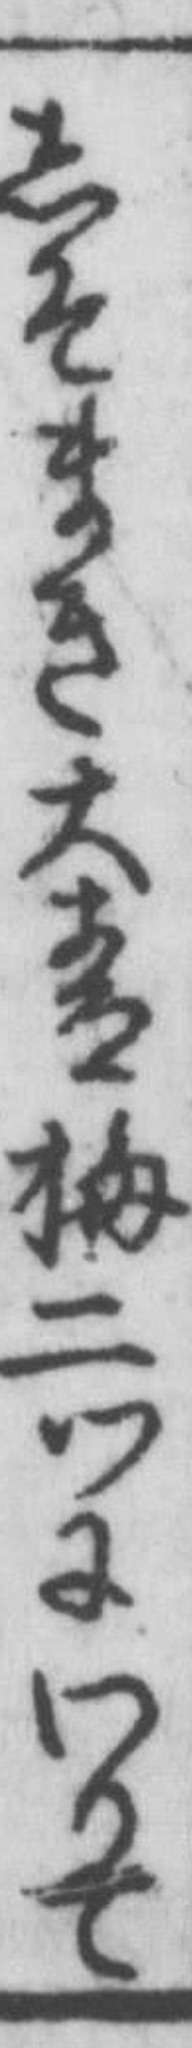しそまき大青梅二ツにワりて
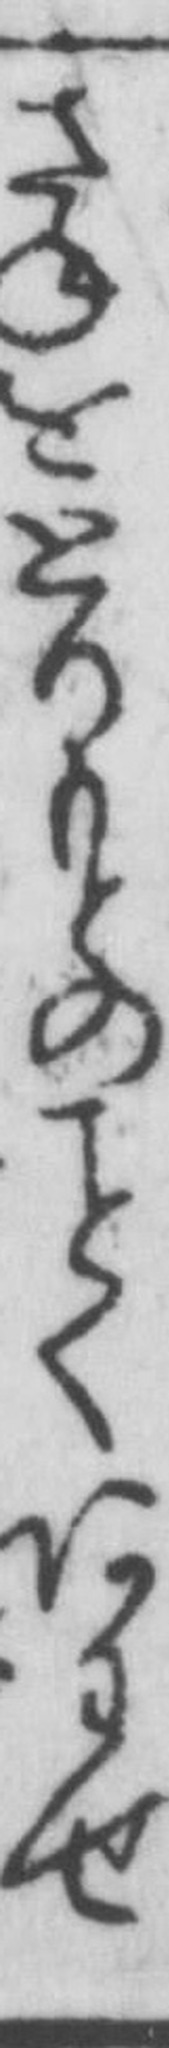たねをとりもとのことくあわせ
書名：料理献立抄
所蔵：大阪府立大学学術情報センター 国文学研究資料館
